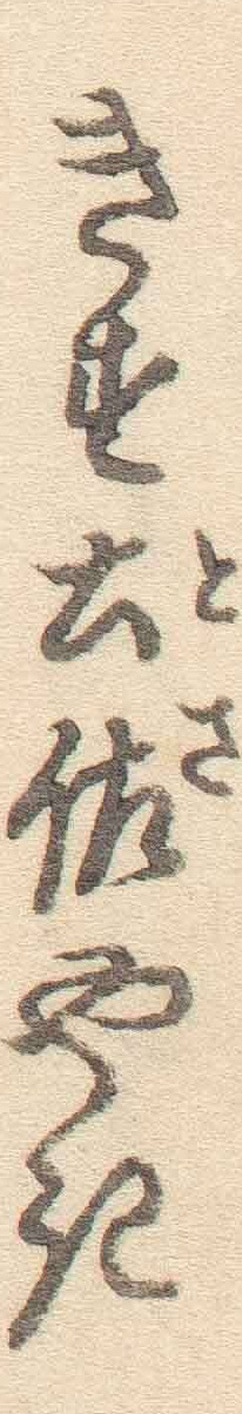きす土佐やき
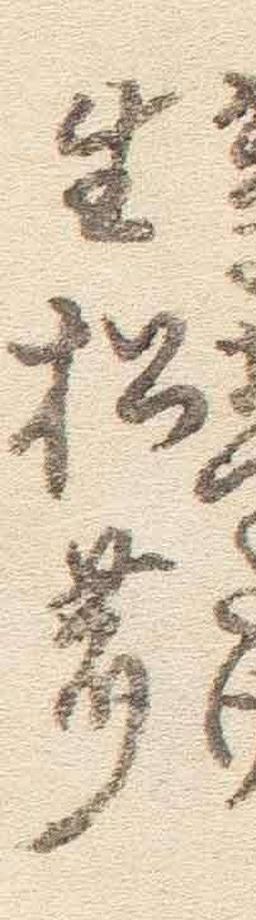生松茸
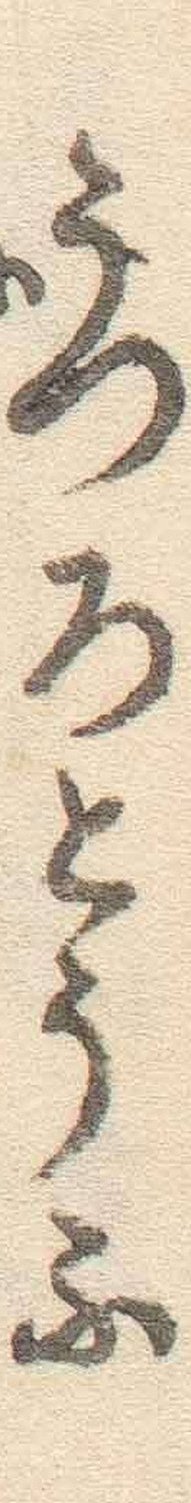うつろとうふ
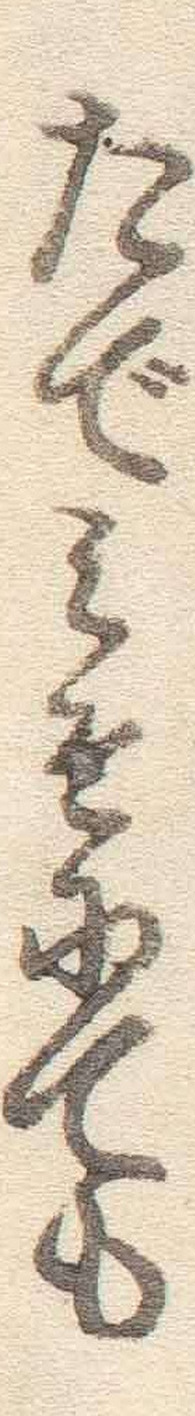たでみそにても
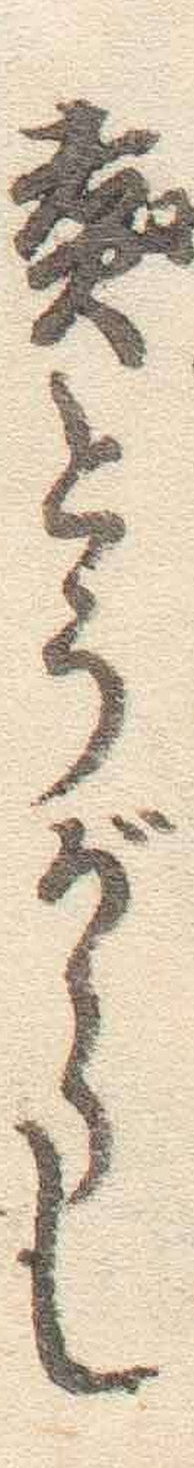煮とうがらし
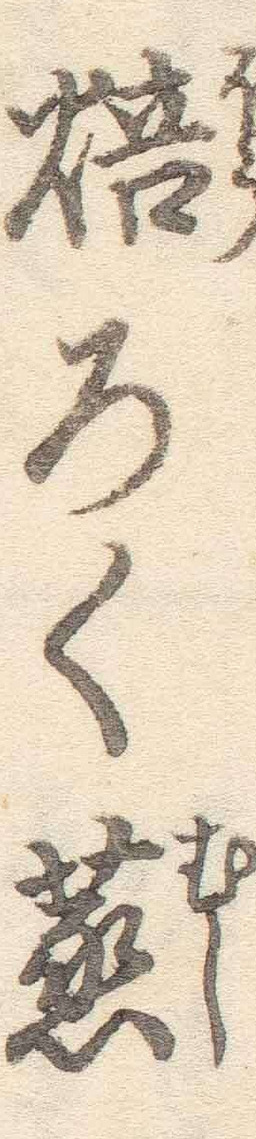焙ろく蒸
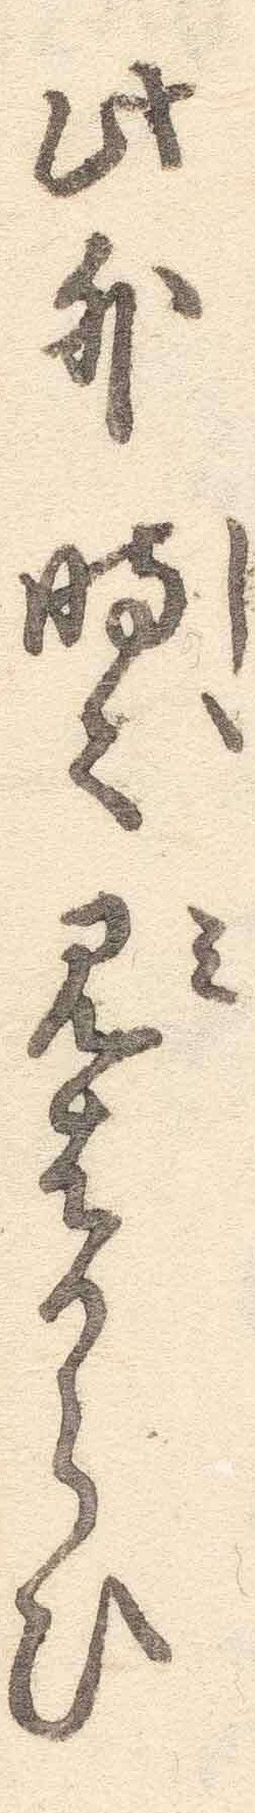此外時々見はからひ
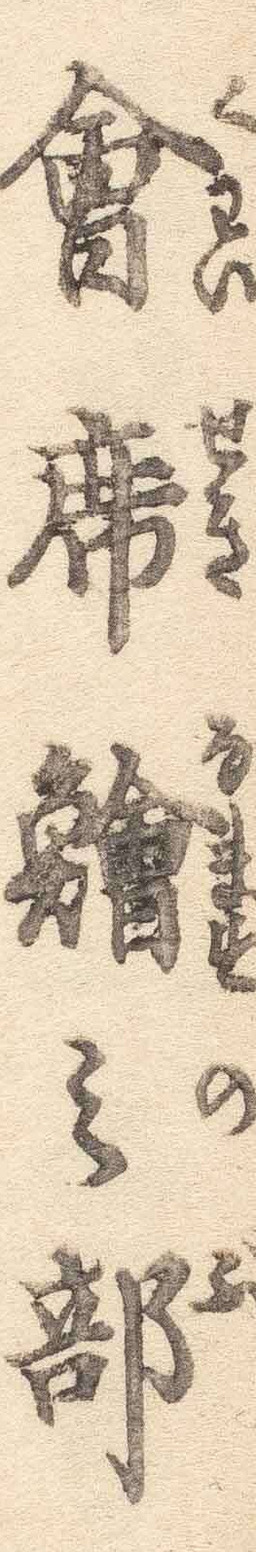会席鱠之部
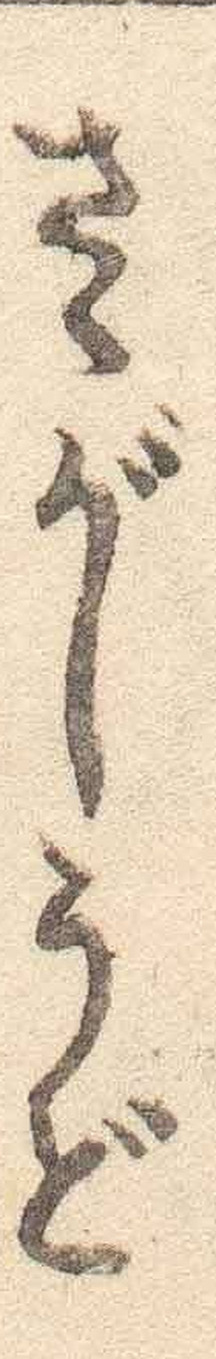さゝがしうど
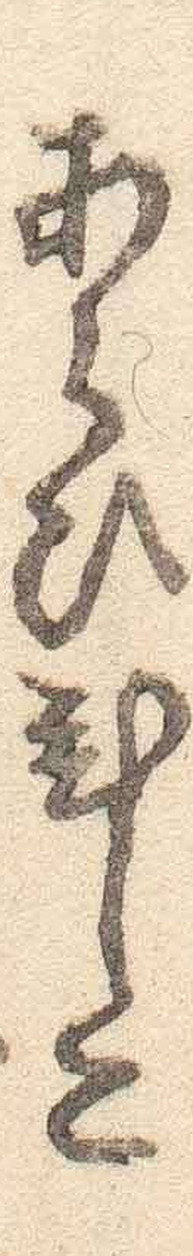あらひひしこ
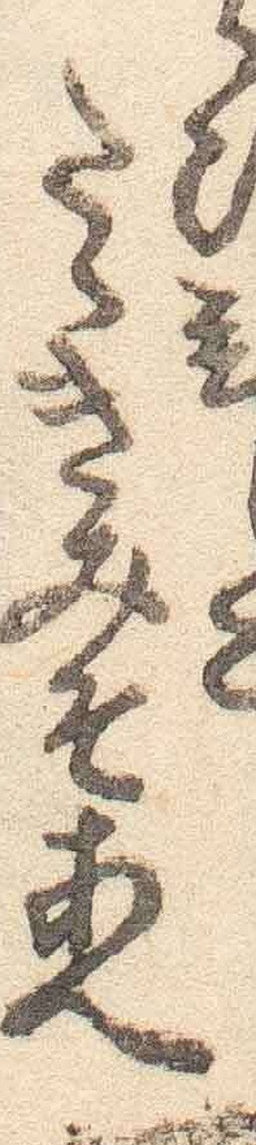たゝきみそあへ
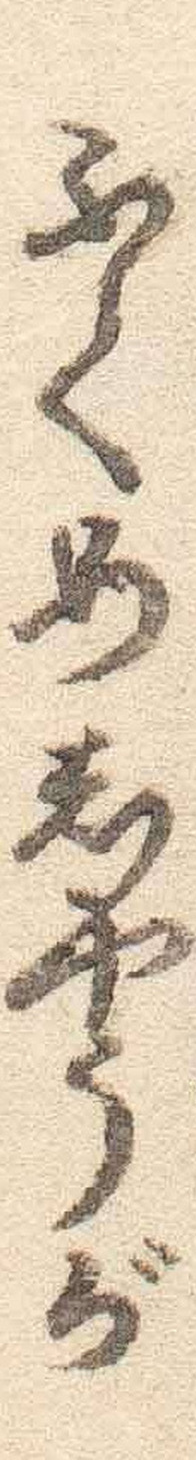ふくめしやうが
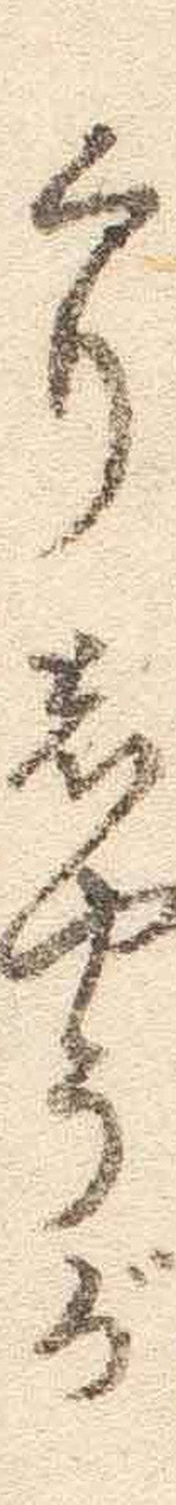ふくめしやうが
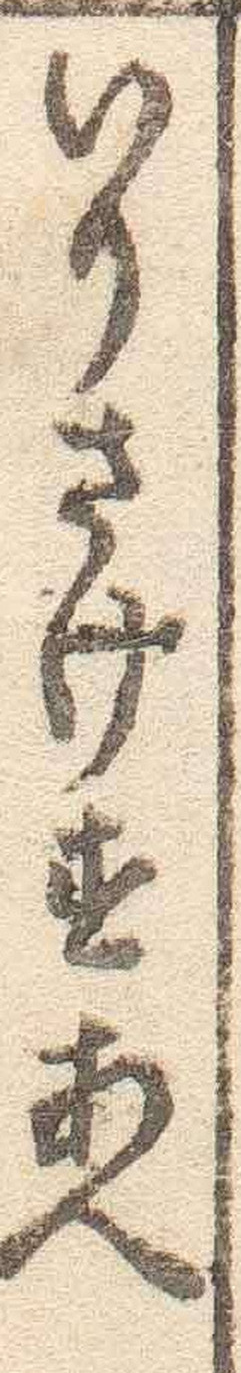いりさけすあへ
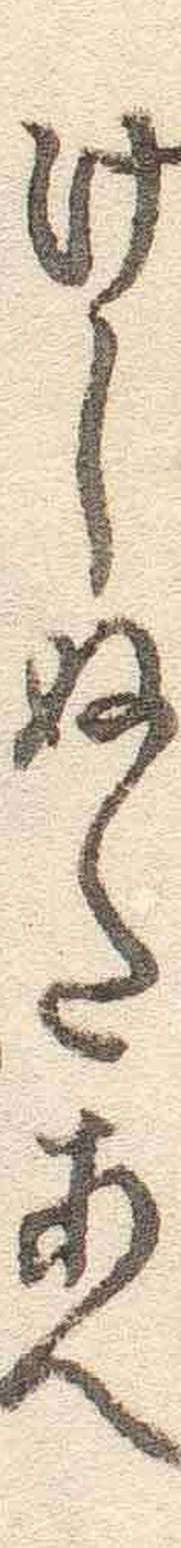きみぬたあへ
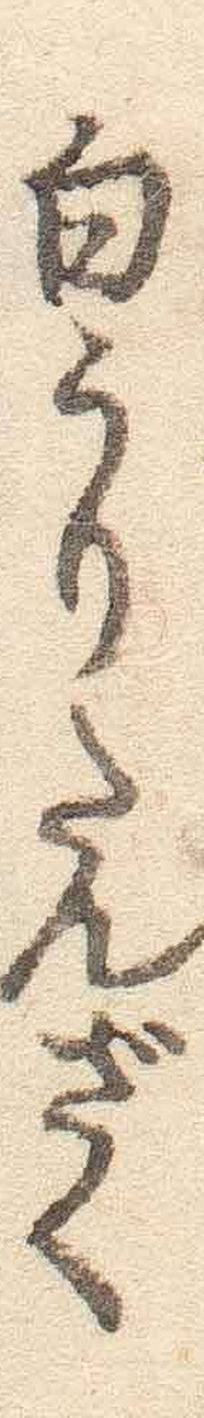白うりたんざく
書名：料理通
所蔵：東京学芸大学附属図書館 国文学研究資料館
